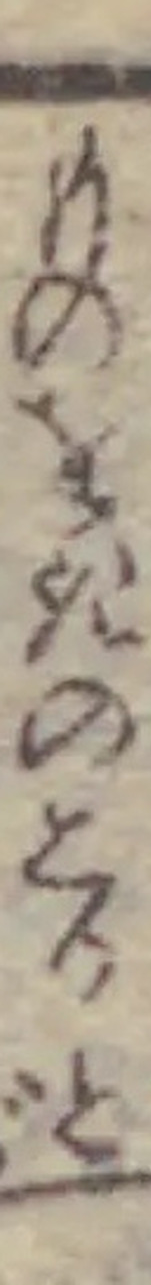ものをきのこると
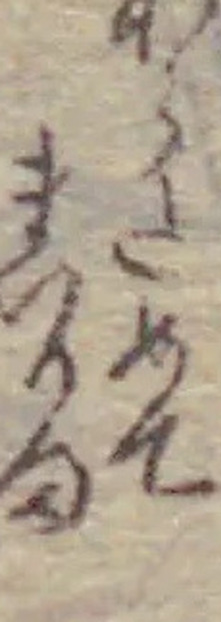まいりま
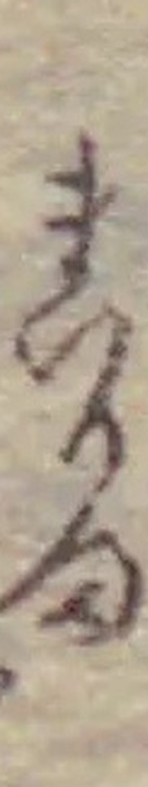まいりま
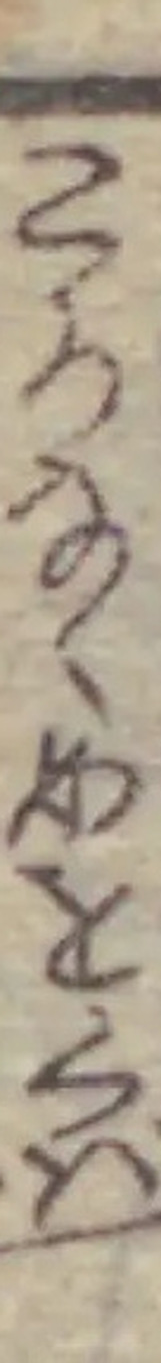ころなくめをくば
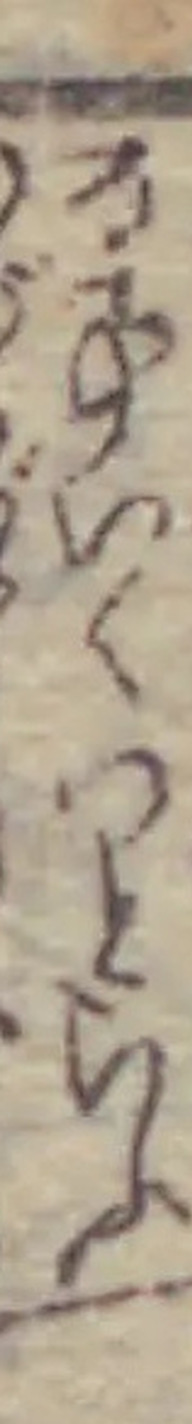る事いくつとらふ
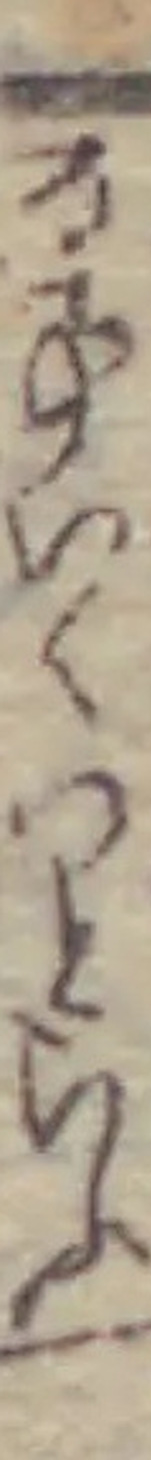る事いくつとらふ
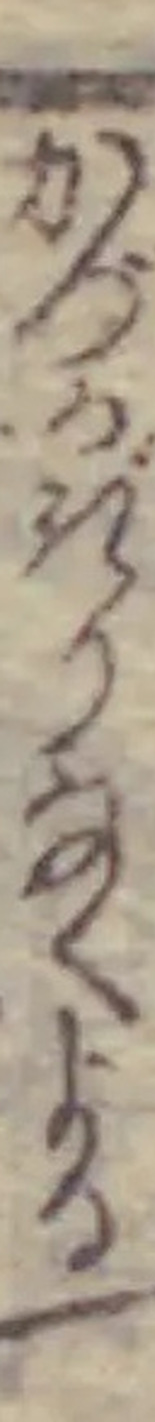かづがきりなくよる
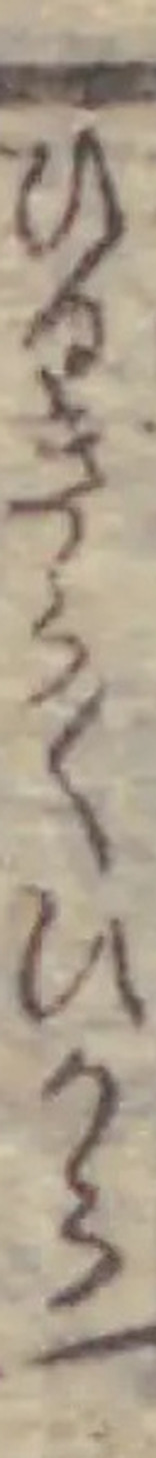ひるきら〳〵ひから
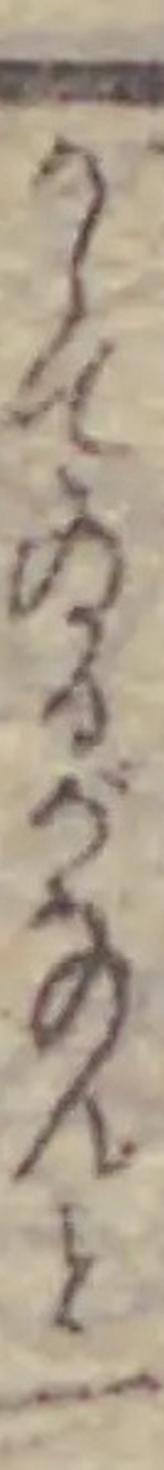かしてゐるがなんと
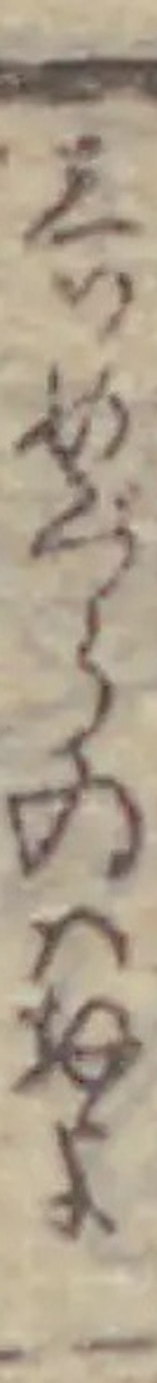三つ目ぐらゐはおよ
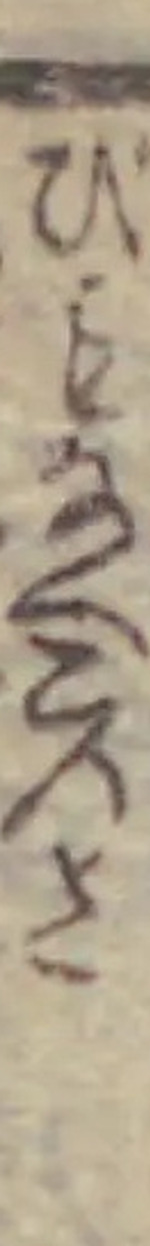びもなへこんた
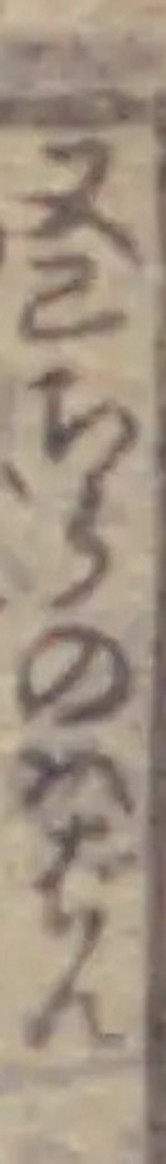又こちらのはばん
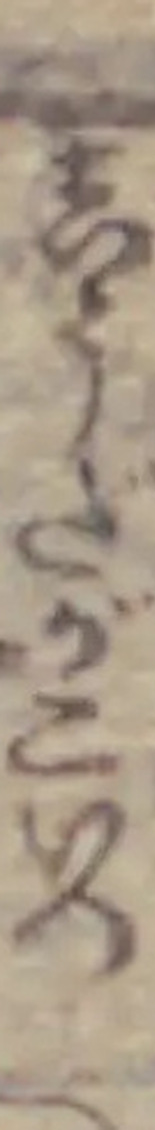しうだがこいつ
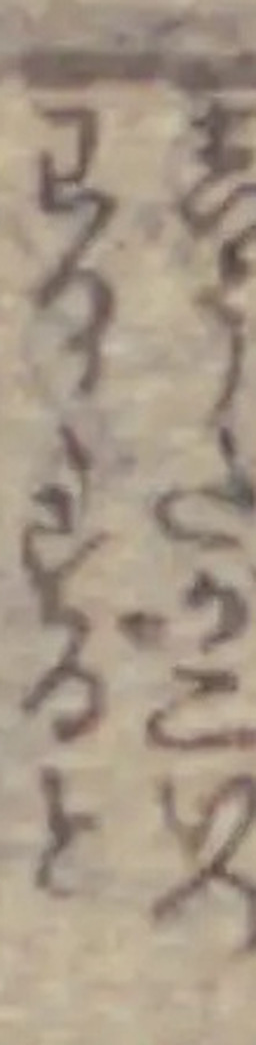わるくすると
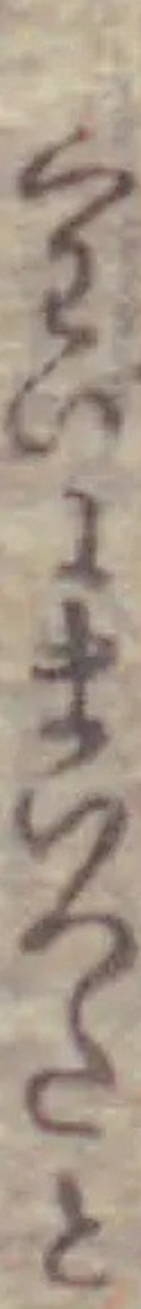くわいにまいつたと
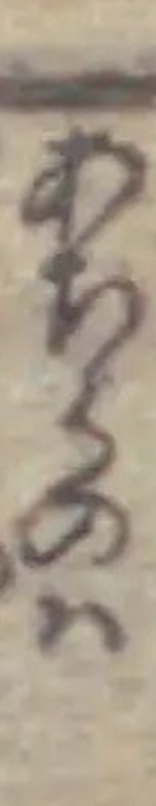あちらのは
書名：化物大閉口 2巻
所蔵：国立国会図書館 National Diet Library, JAPAN
